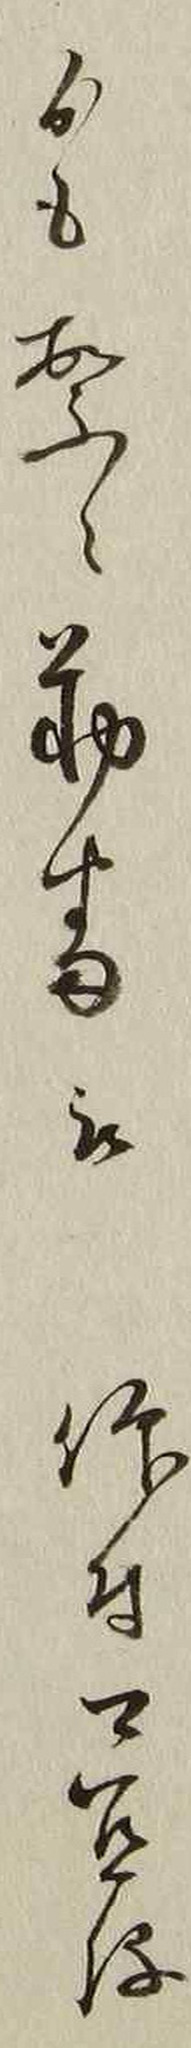ゟも案之勤番被仰付可宜儀
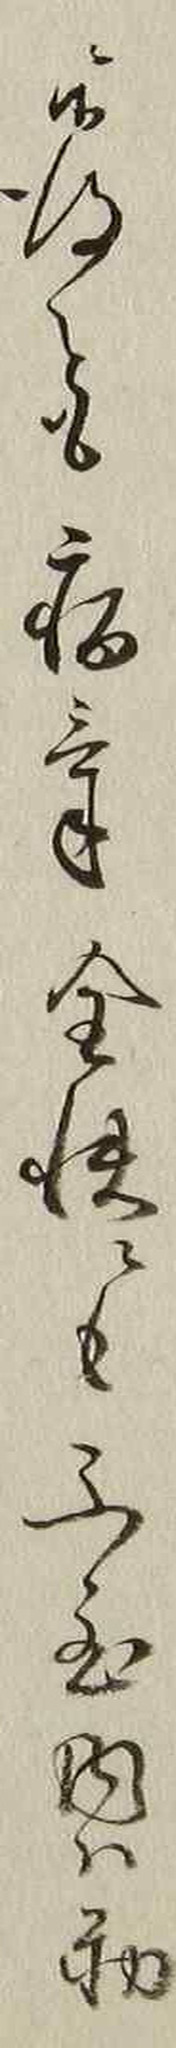に候得とも病気全快にも不至内は勤
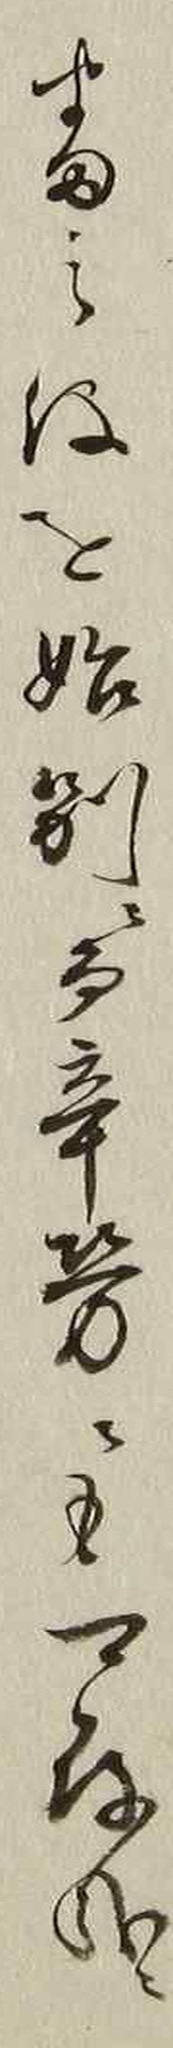番之儀を始別に而辛労にも可成哉に
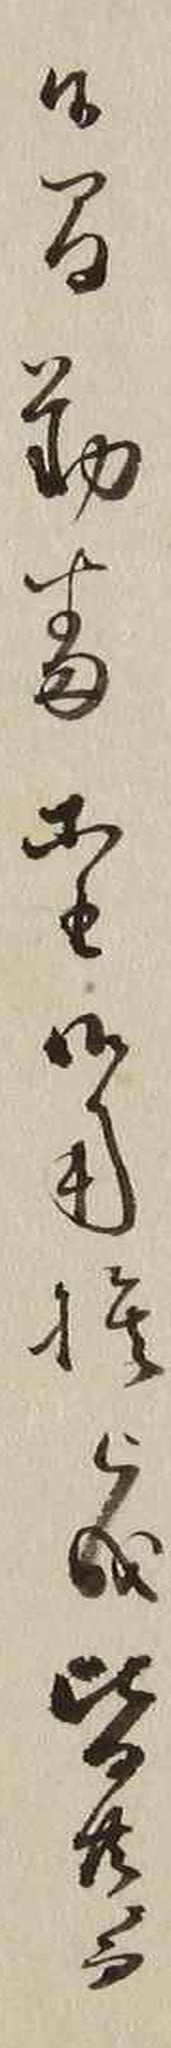候間勤番等も御用捨被成皆共に而
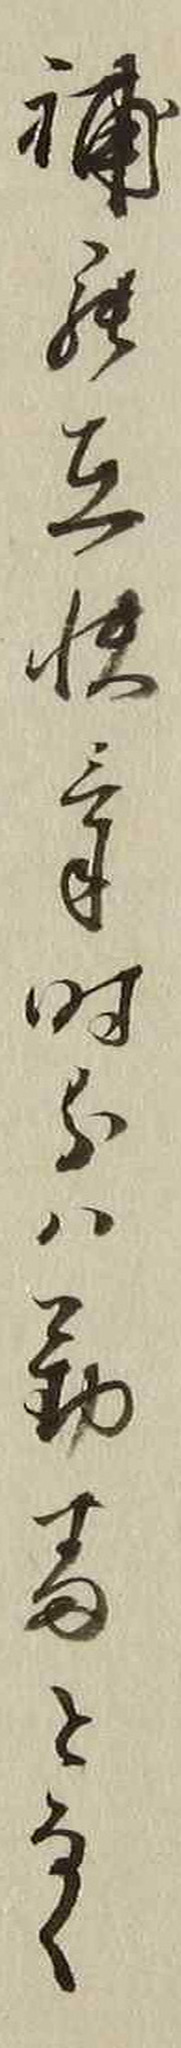補罷在快気時分は勤番となく
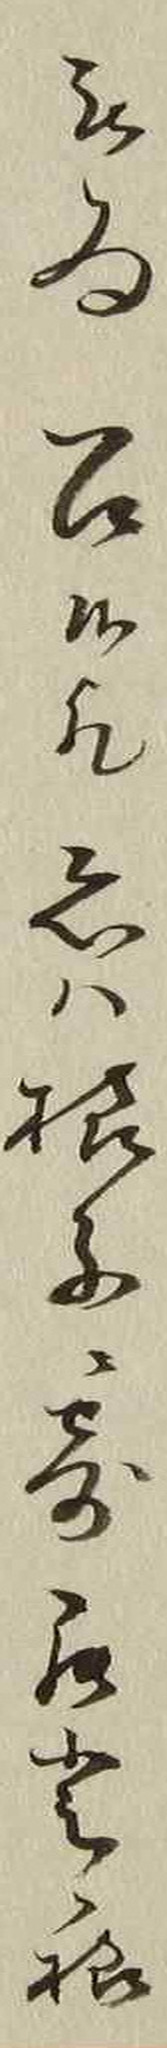被為召候歟之は様子に寄罷登候様
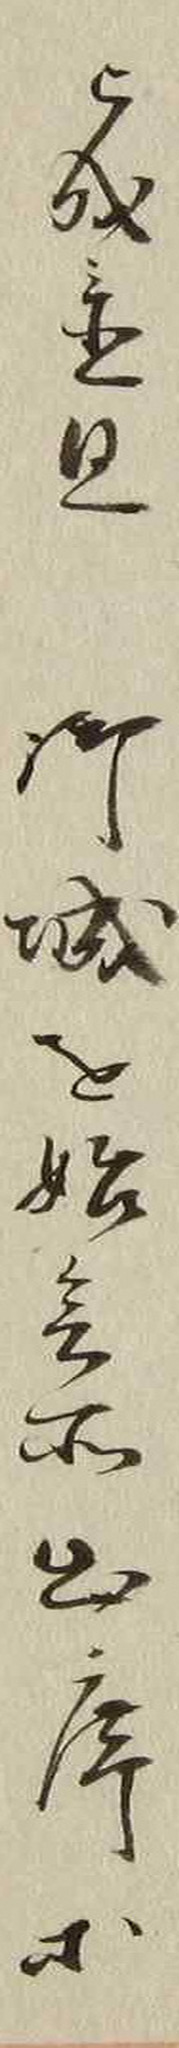被成置旦御城を始会所出席等
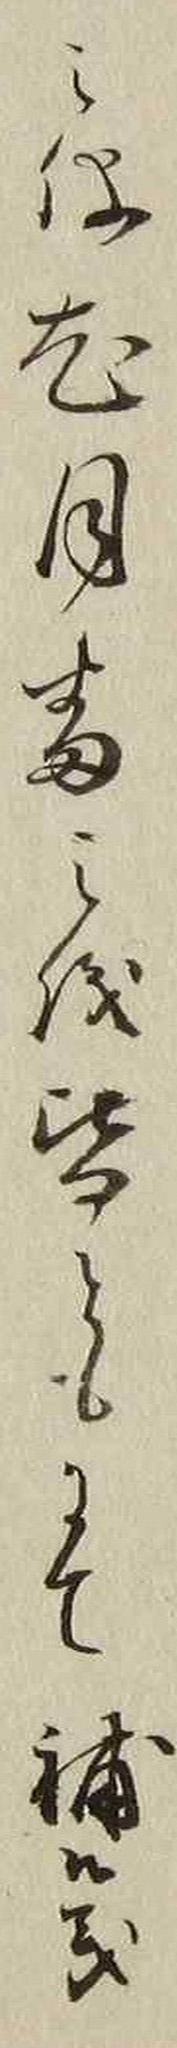之儀尤月番之儀皆ともにて補候義
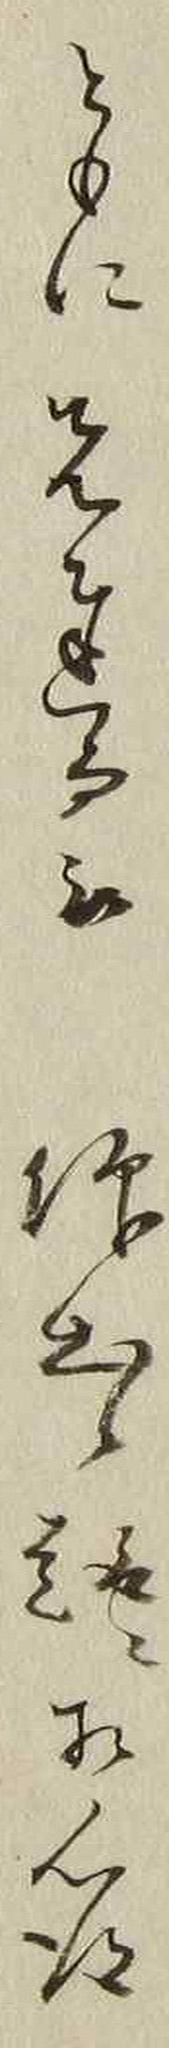ともに先達而被仰出候趣に相心得
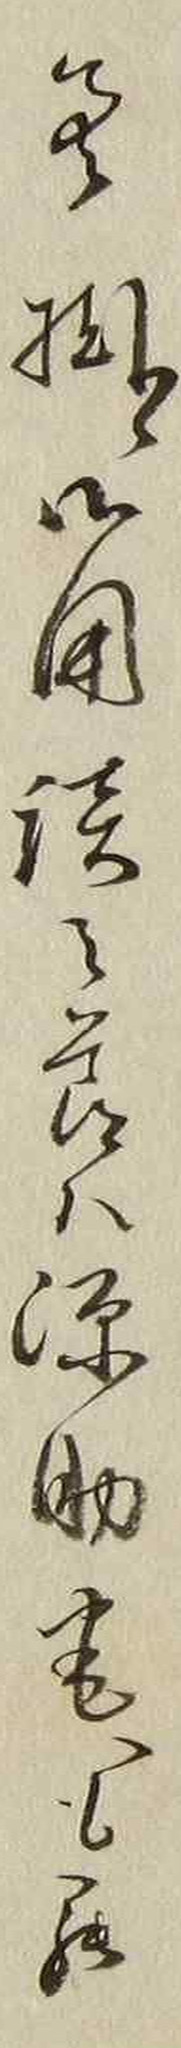有掛に御用談之節は源助宅へも罷
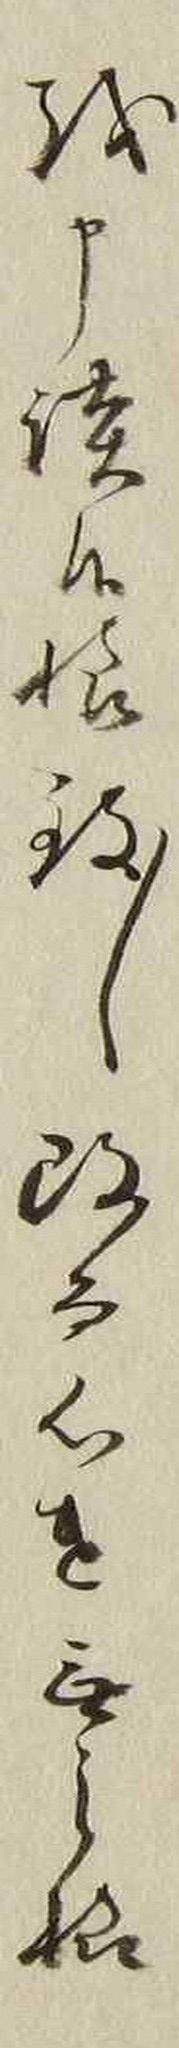越申談候様致し改而心遣無之様
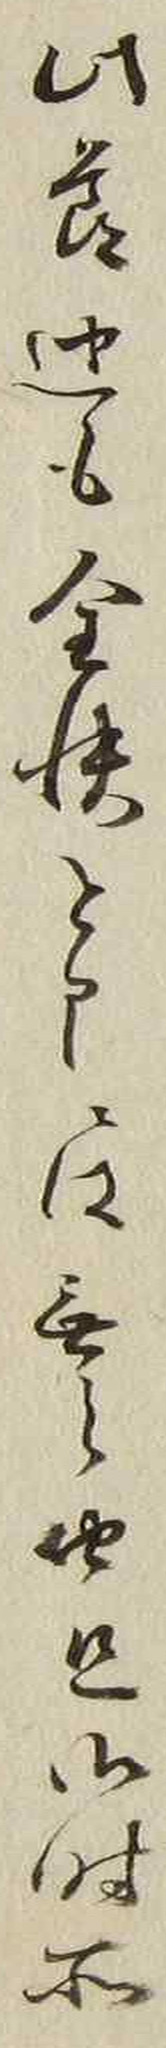一此節迚も全快と申には無之由旦御時所
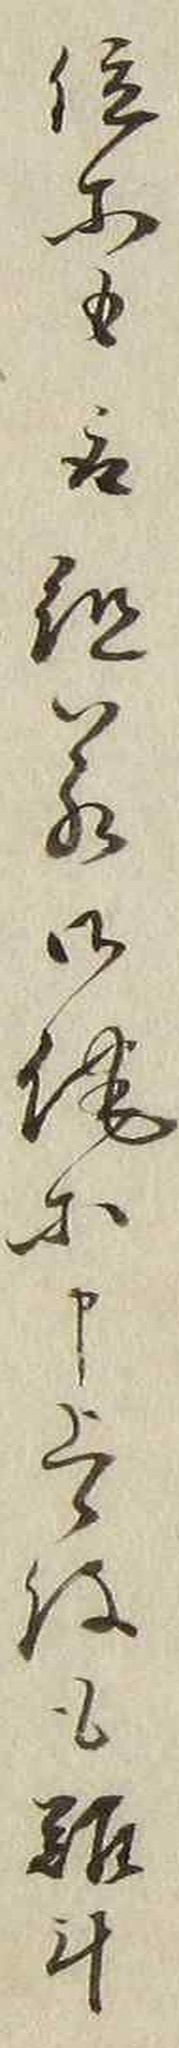位にも取組若御詫等申上候儀も難斗
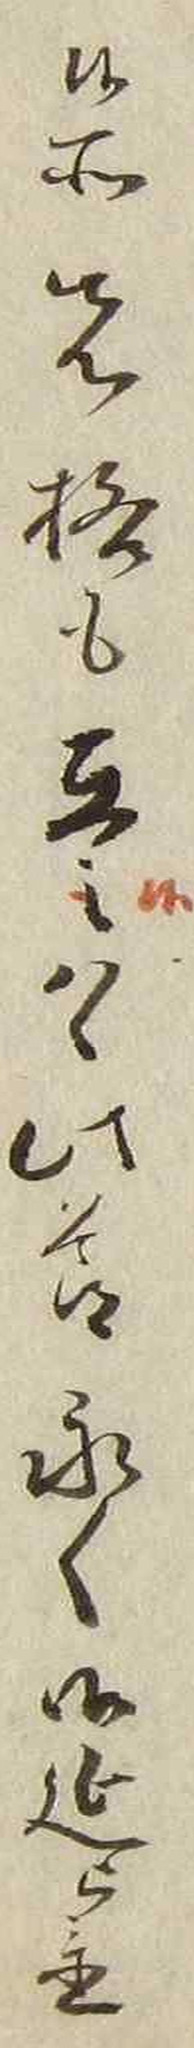候所先格も在之はゝ此節永々御延被置

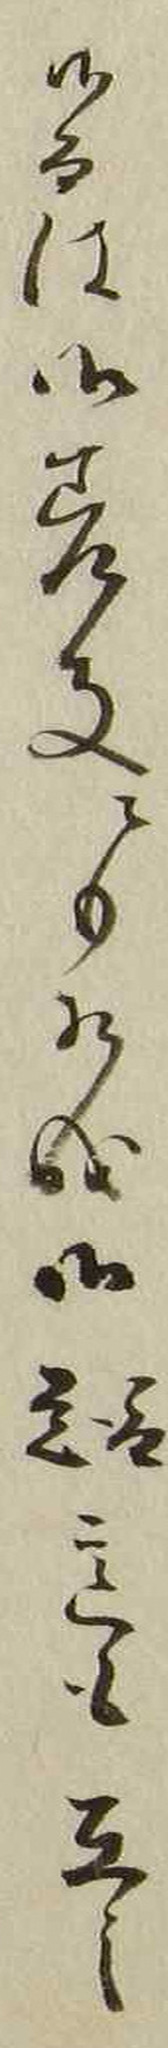候而は御差支にも候哉御趣意も在之
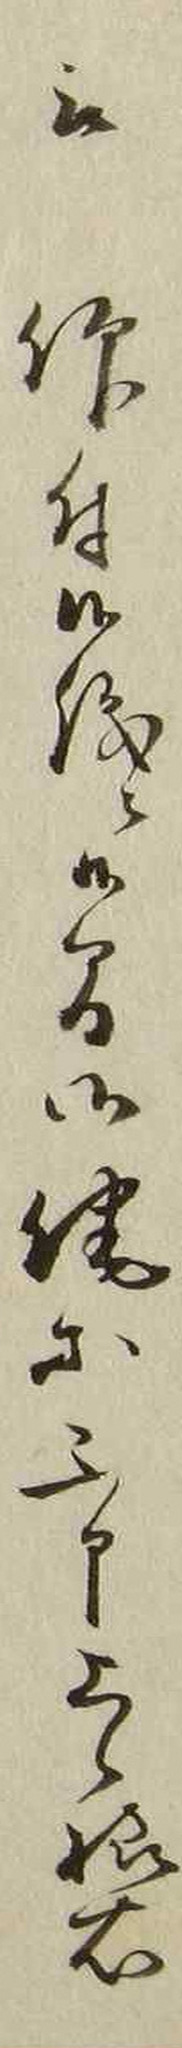被仰付御儀に候間御詫等不申上候様右
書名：諸士系譜　巻之159　な之部1
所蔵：会津若松市立会津図書館
